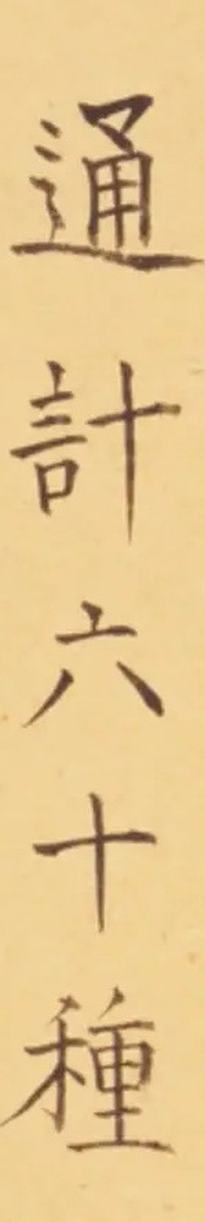通計六十種
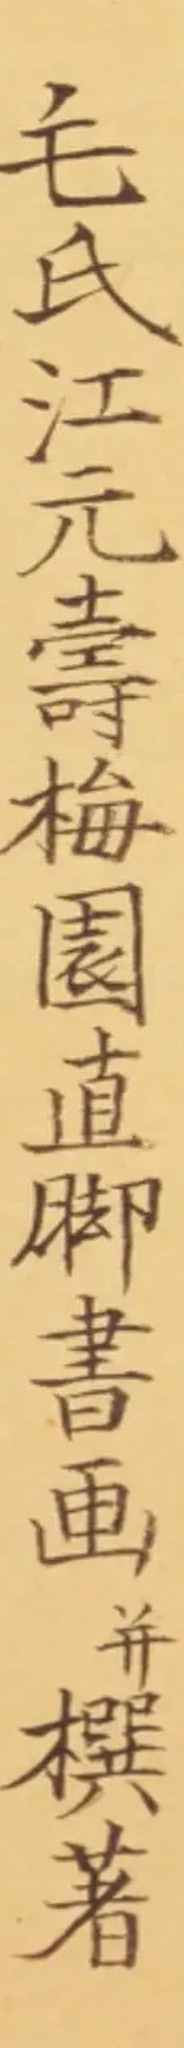毛氏江元寿梅園直脚書画并撰著

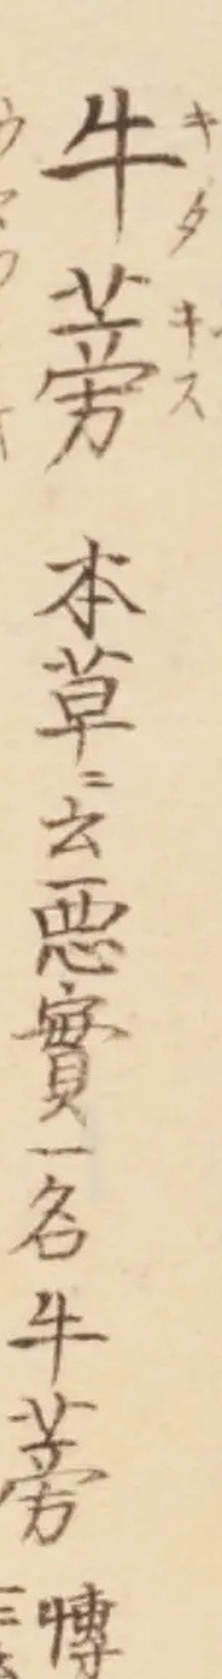牛蒡本草云実一名牛蒡
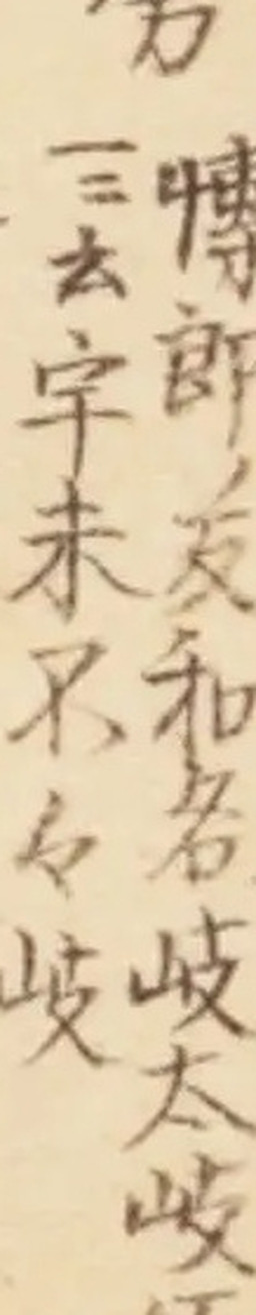一宇未不々岐
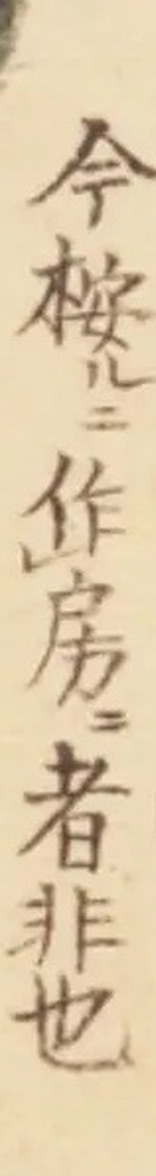今桉作房者非也
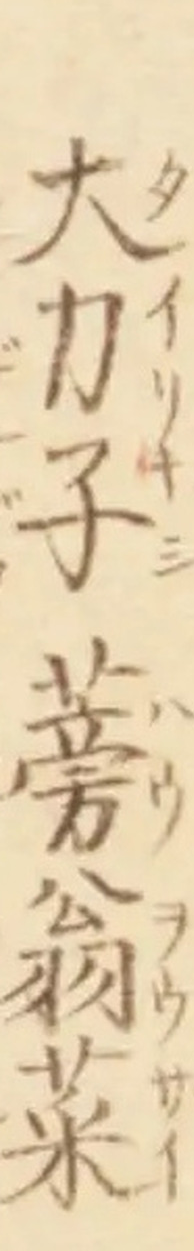大力子蒡翁菜
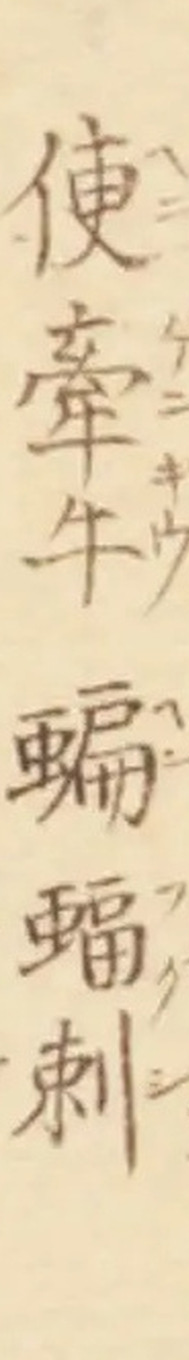便牽牛蝙蝠剌

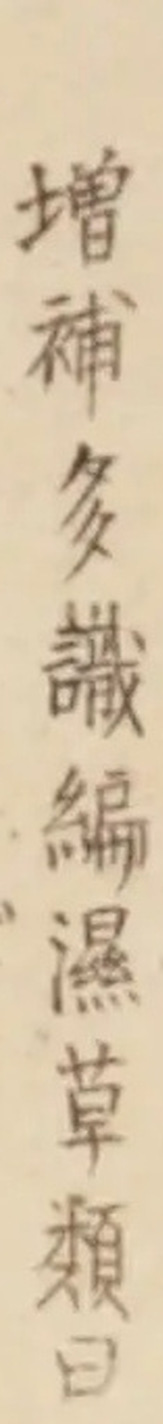増補多識湿草類曰
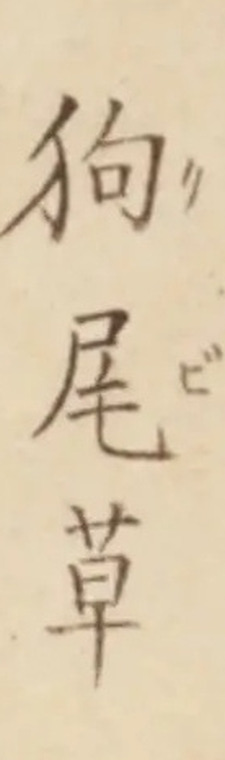狗尾草
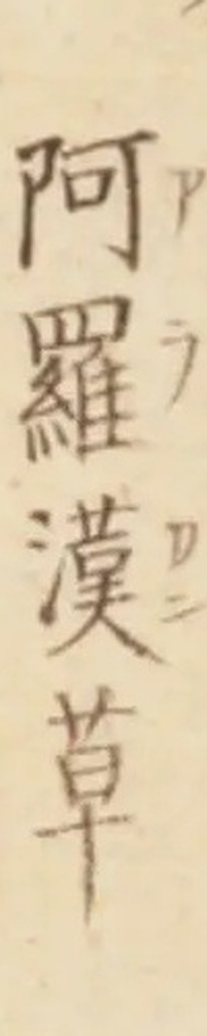阿羅漢草
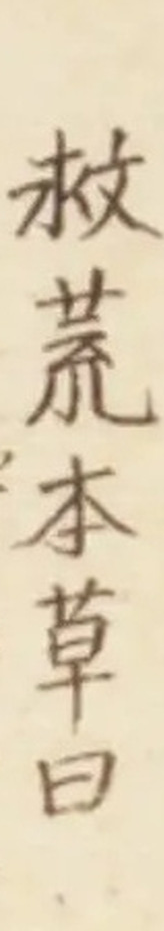救荒本草曰
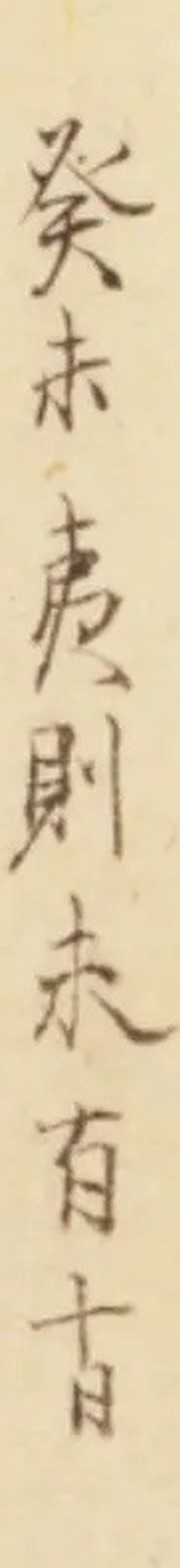癸未夷則未有十日
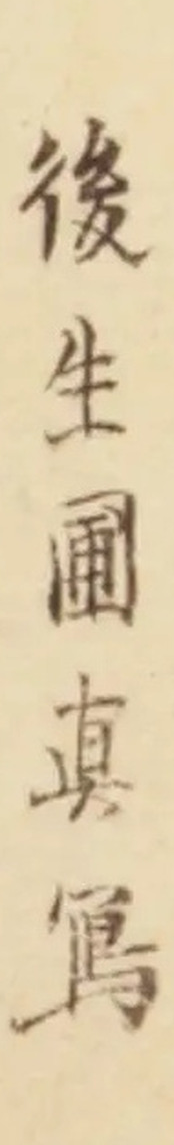後生圃真写
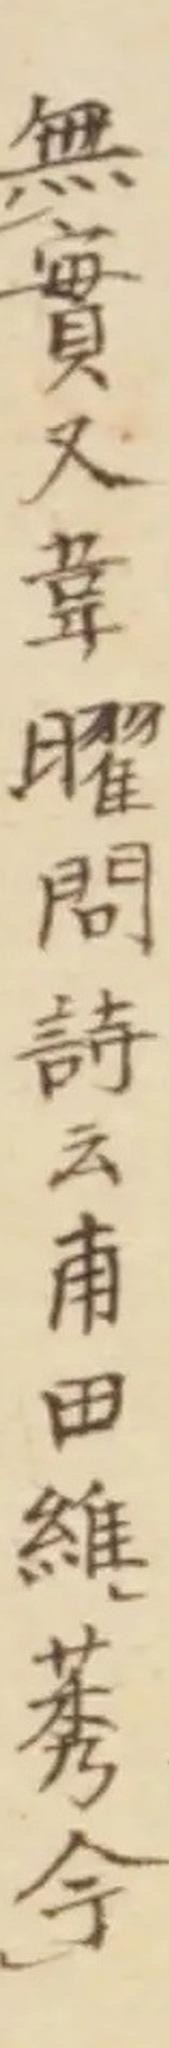無実又韋曜問詩云甫田維莠今

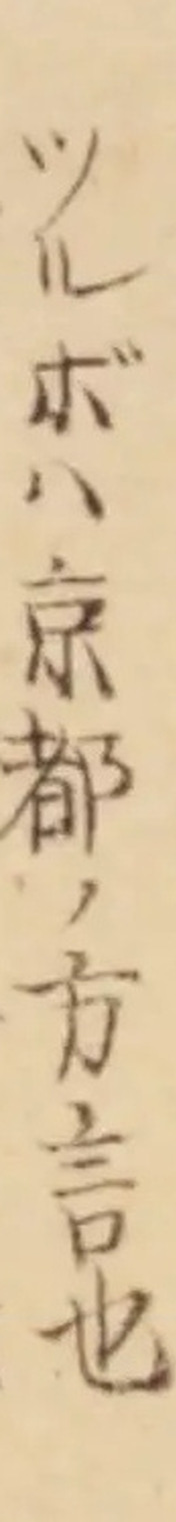ツルボハ京都ノ方言也
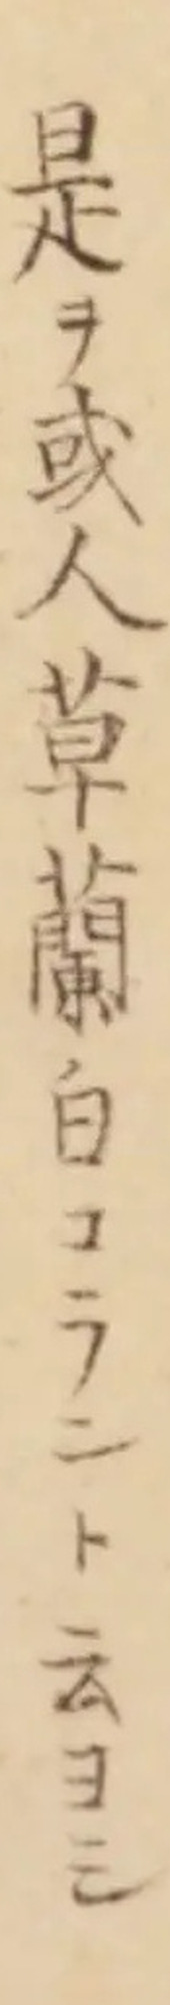是ヲ或人草蘭白コラント云ヨシ
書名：梅園草木花譜秋之部. 2
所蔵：国立国会図書館 National Diet Library, JAPAN
